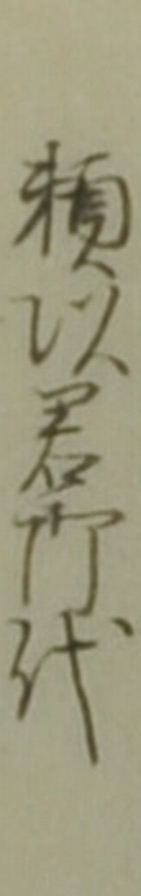頼以君御代
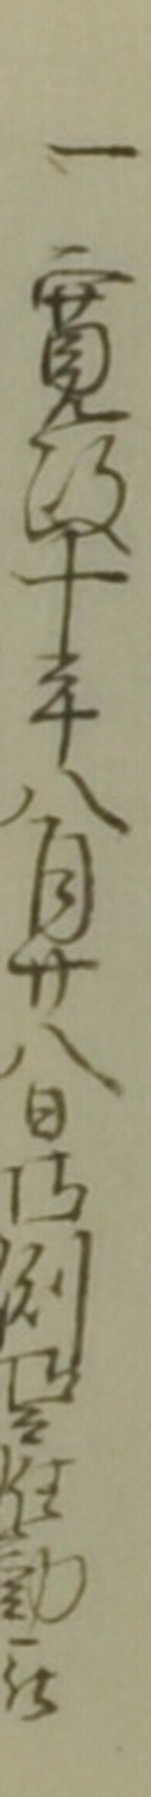一寛政十年八月廿八日御側御雇勤被
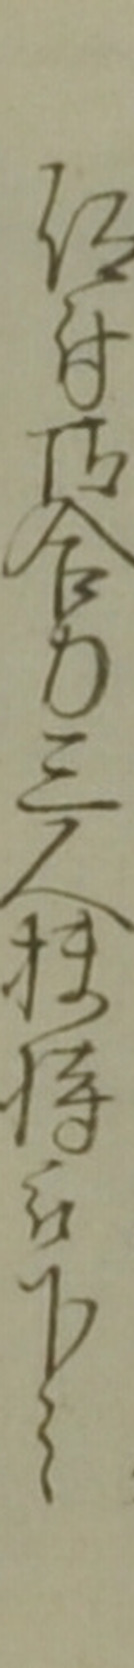仰付御合力三人扶持被下之
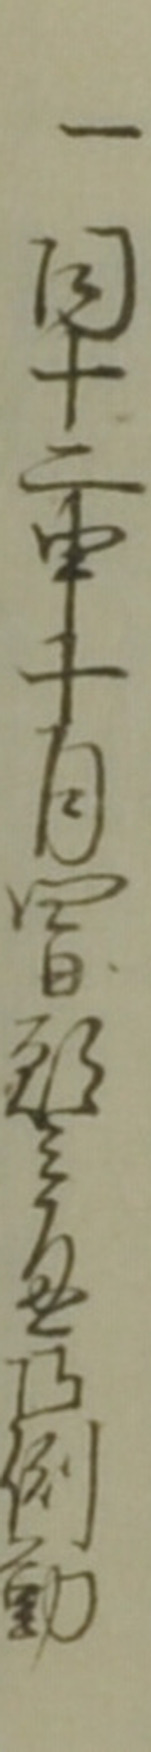一同十二申十月四日願之通御側勤
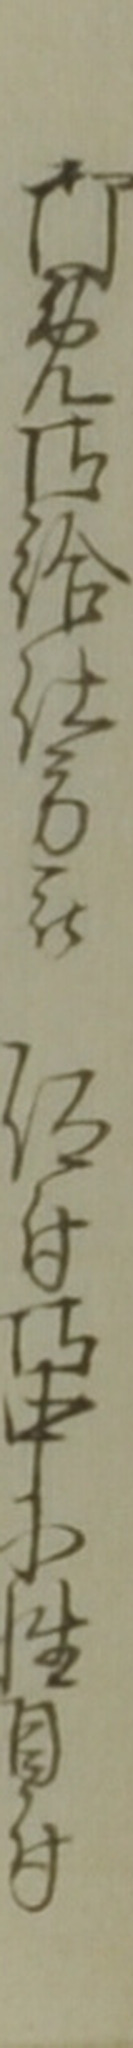御免御給仕方被仰付御中小性目付
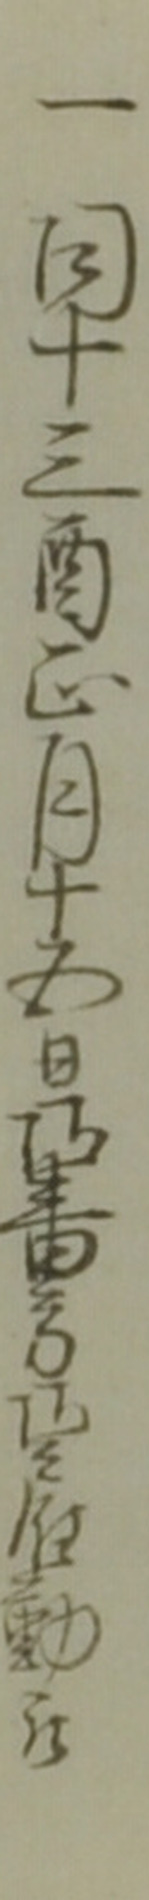一同十三酉正月十五日御番方御雇勤被
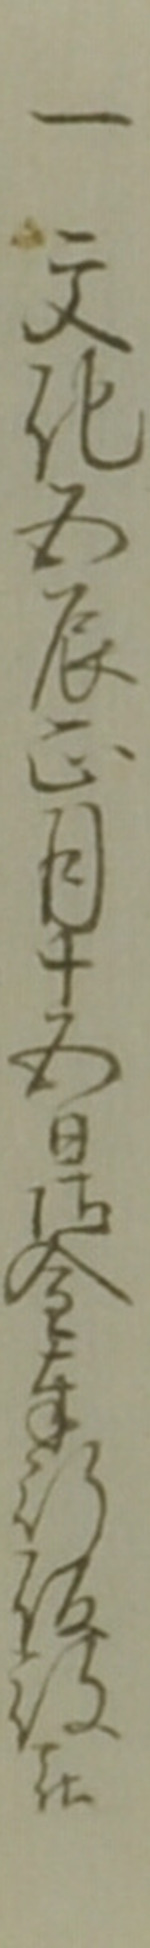一文化五辰正月十五日御金奉行仮役被
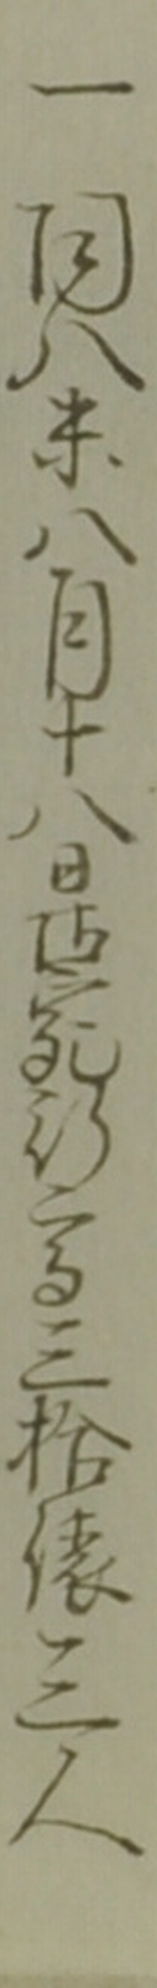一同八未八月十八日御宛行高三拾俵三人
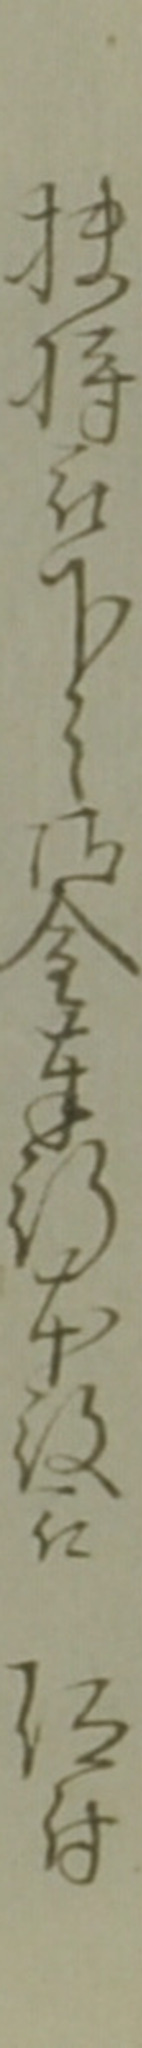扶持被下之御金奉行本役被仰付
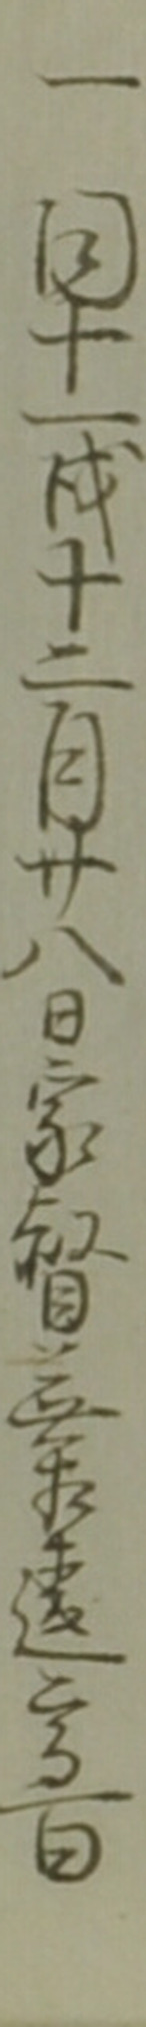一同十一戌十二月廿八日家督無相違高百
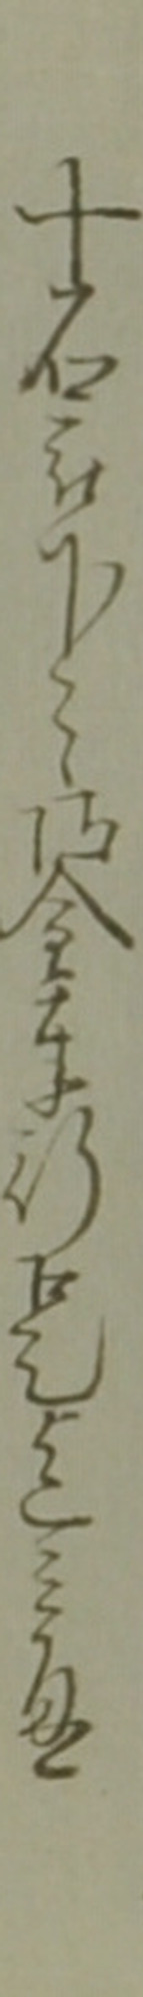十石被下之御金奉行是迄之通
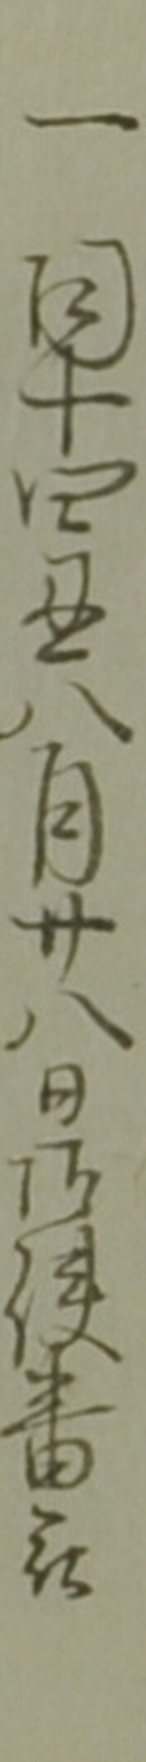一同十四丑八月廿八日御使番被
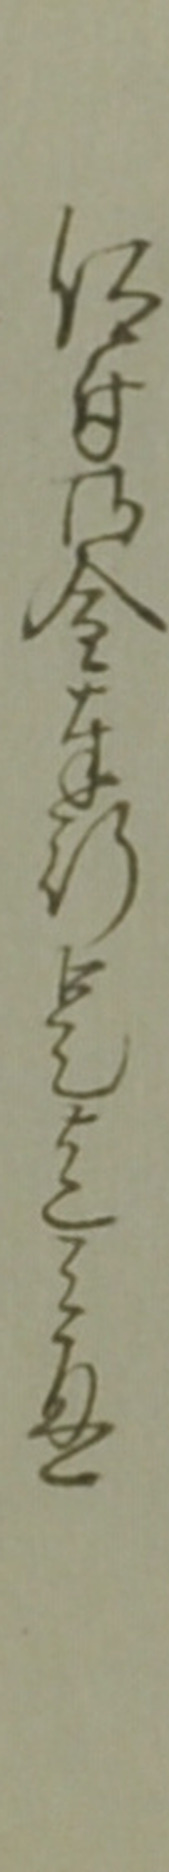仰付御金奉行是迄之通
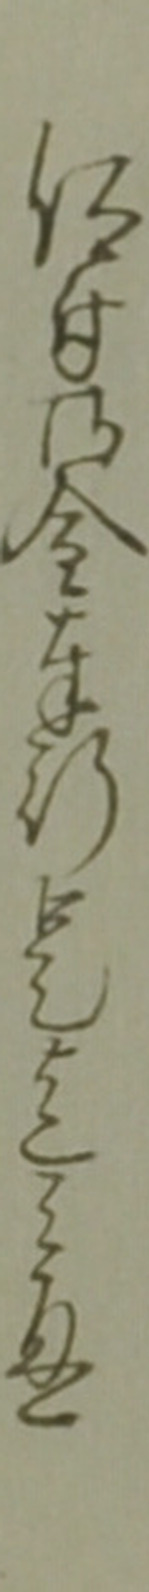仰付御金奉行是迄之通
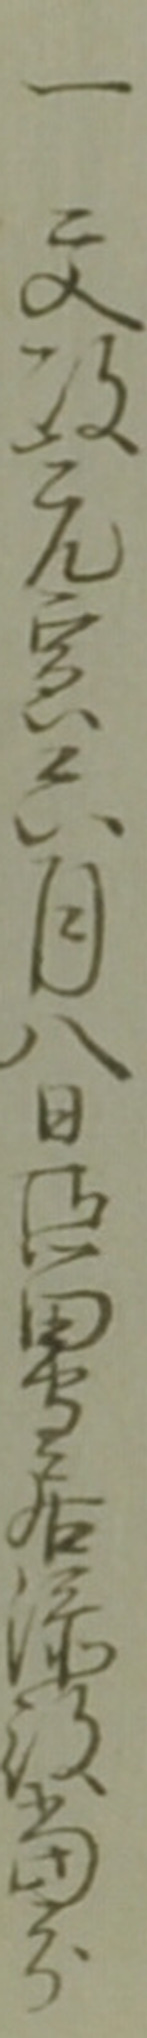一文政元寅六月八日御留守居添役当分
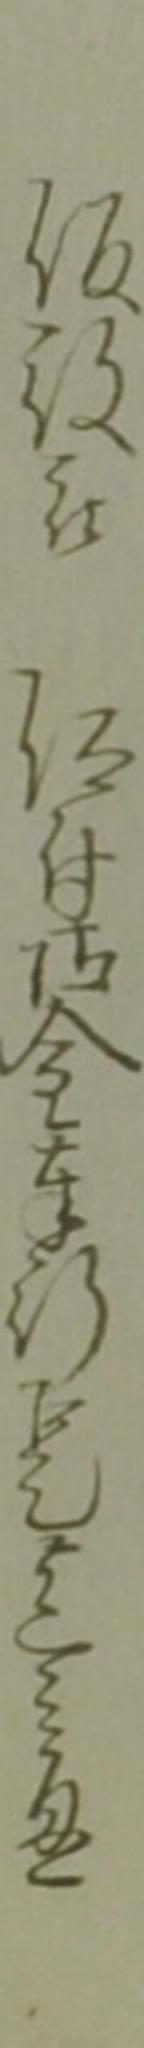仮役被仰付御金奉行是迄之通
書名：給人諸士勤仕録（三）
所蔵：伊那市立高遠町図書館・合同会社AMANE
